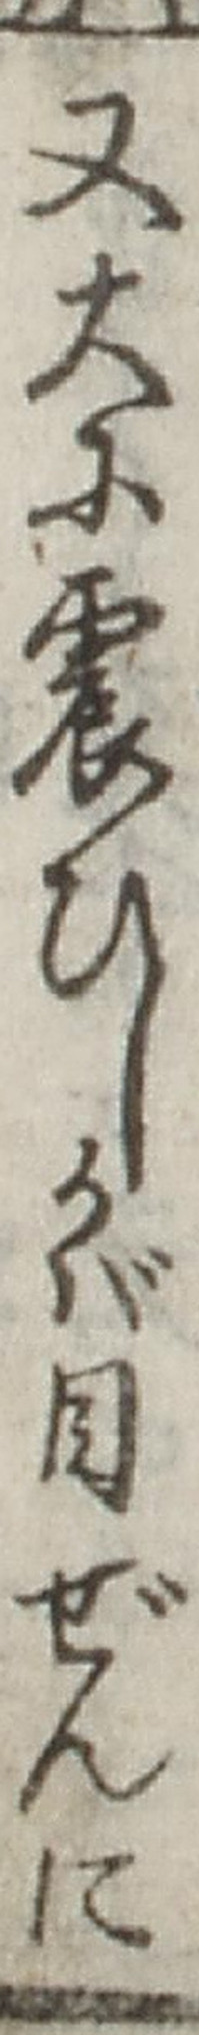又大に震ひしかバ目ぜんに
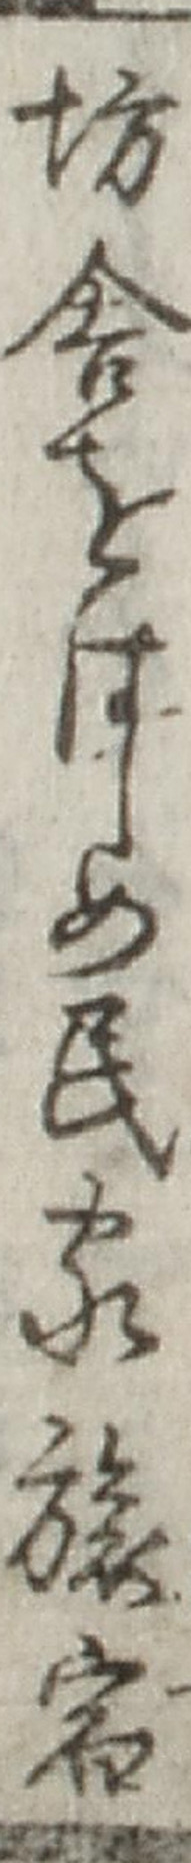坊舎をはじめ民家旅宿
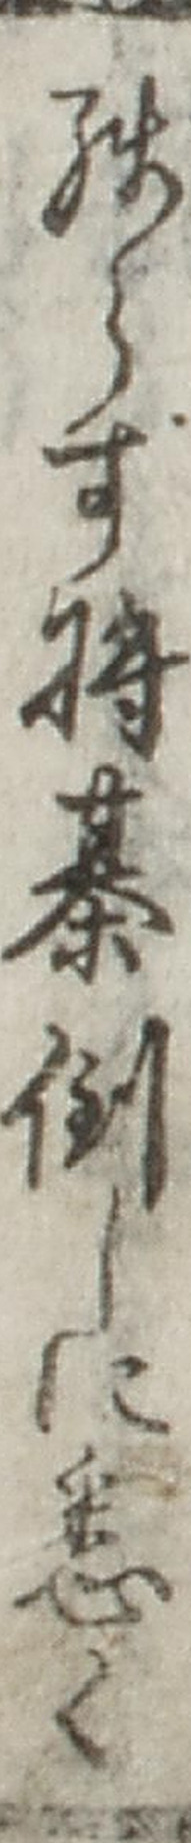残らず将棋倒しに悉く
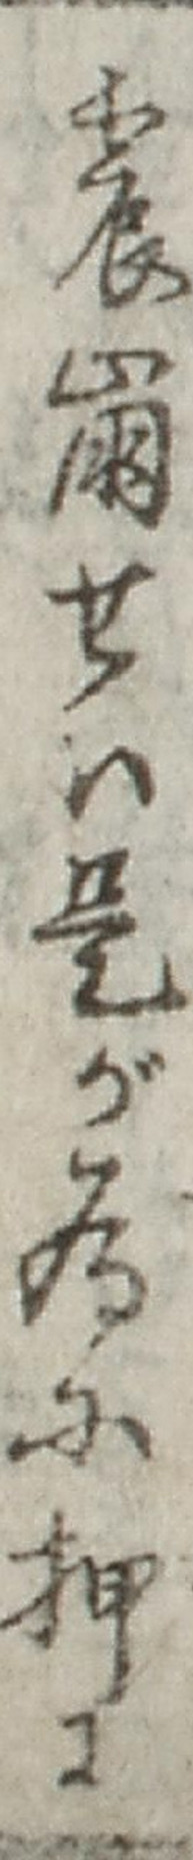震崩せハ是が為に押に

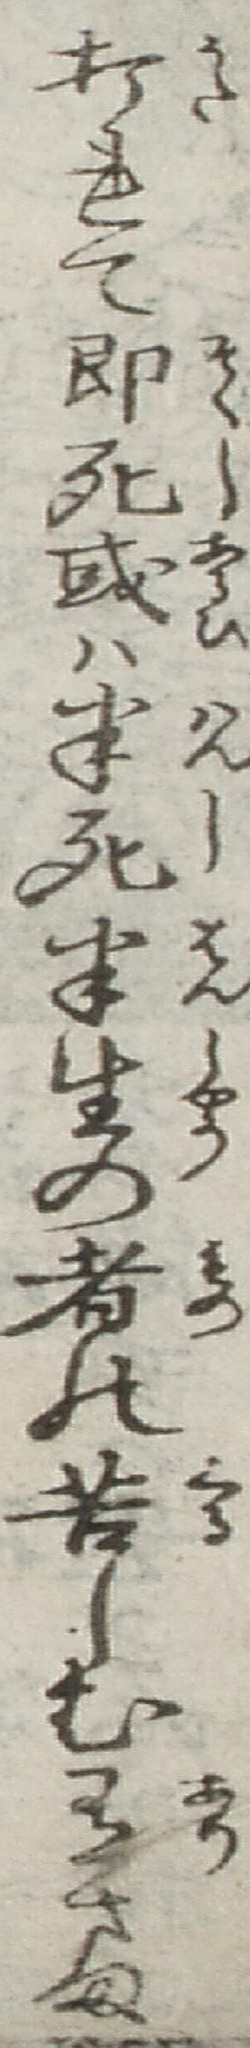打れて即死或は半死半生の者の苦しむ有さま
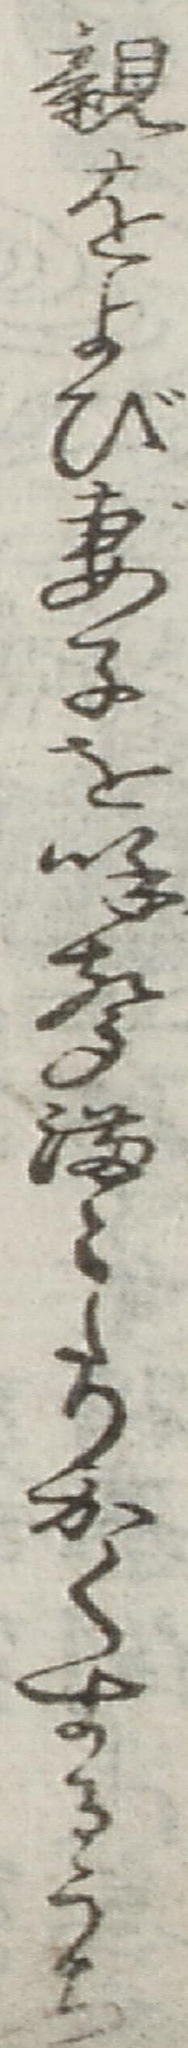親をよび妻子を呼聲満たりかくするうち
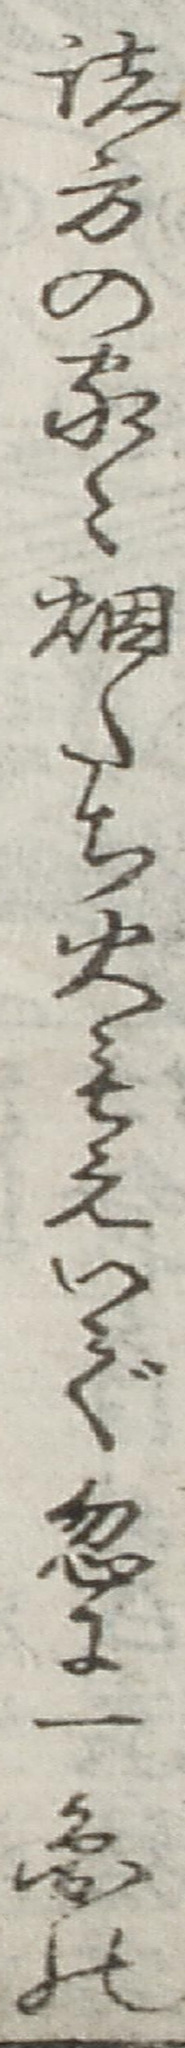諸方の家烟たち火もえいで忽に一圓の
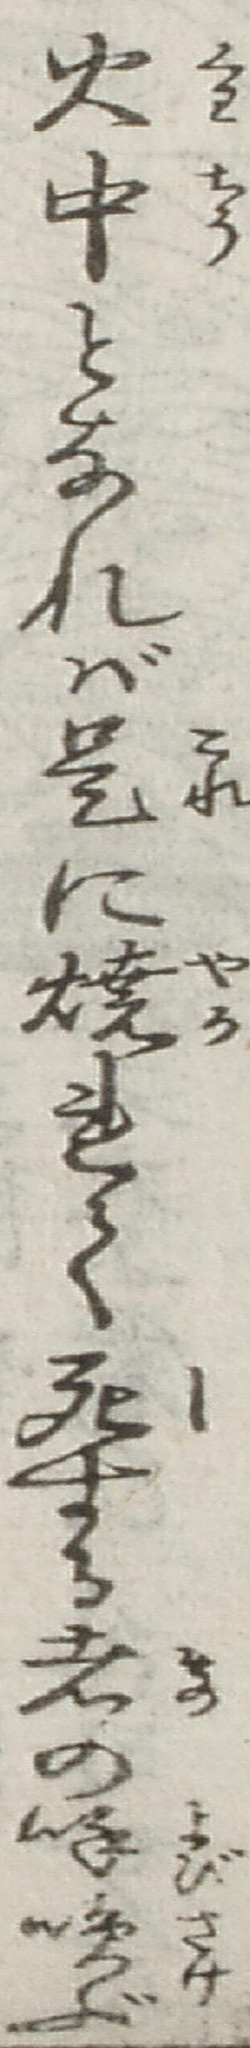火中となれば是に焼れて死する者の呼喚ぶ
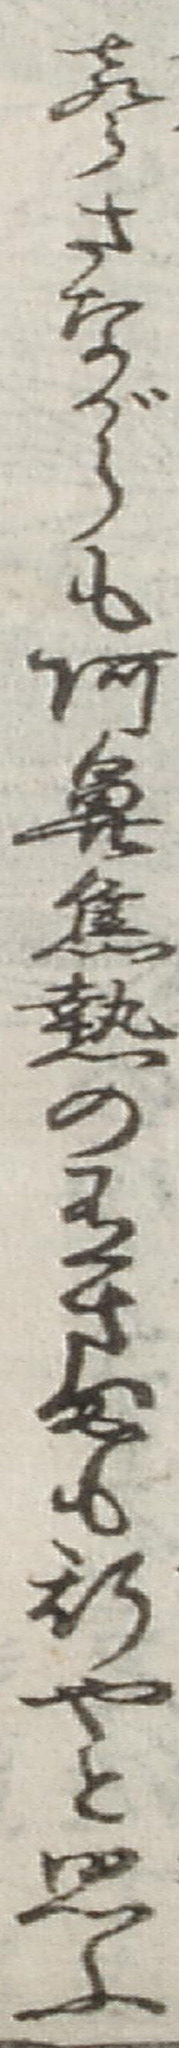聲さながらも阿鼻焦熱の有さまも斯やと思ふ
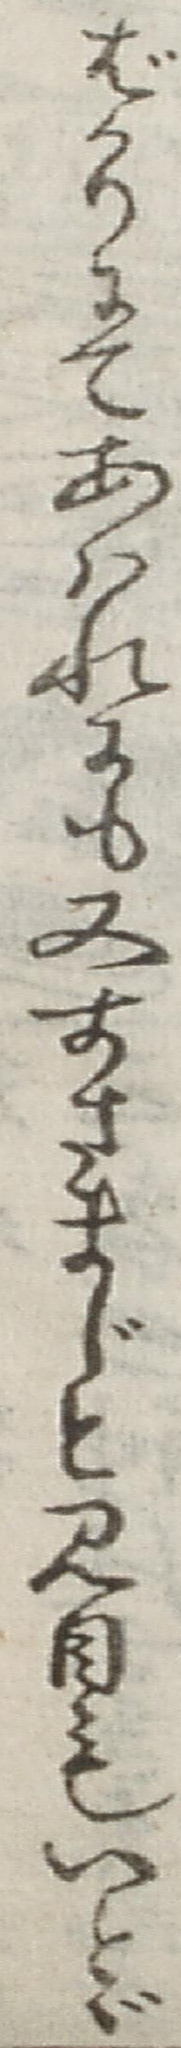ばかりにてあはれにも又すさまじと見目もいとゞ
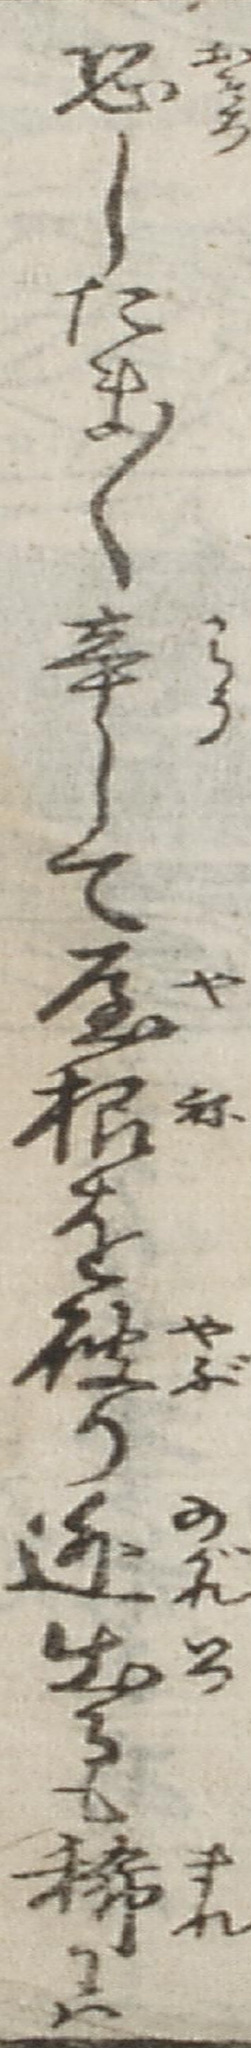恐したま〳〵辛して屋根を破り逃出るも稀には
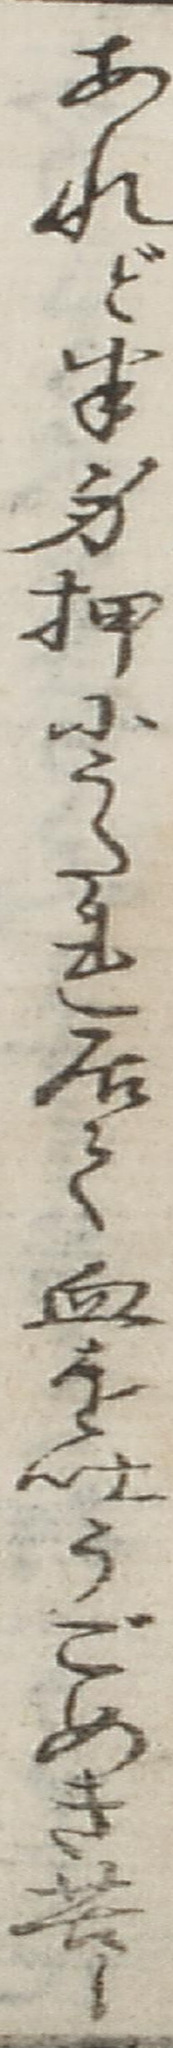あれど半身押にうたれ居て血を吐うごめき苦し
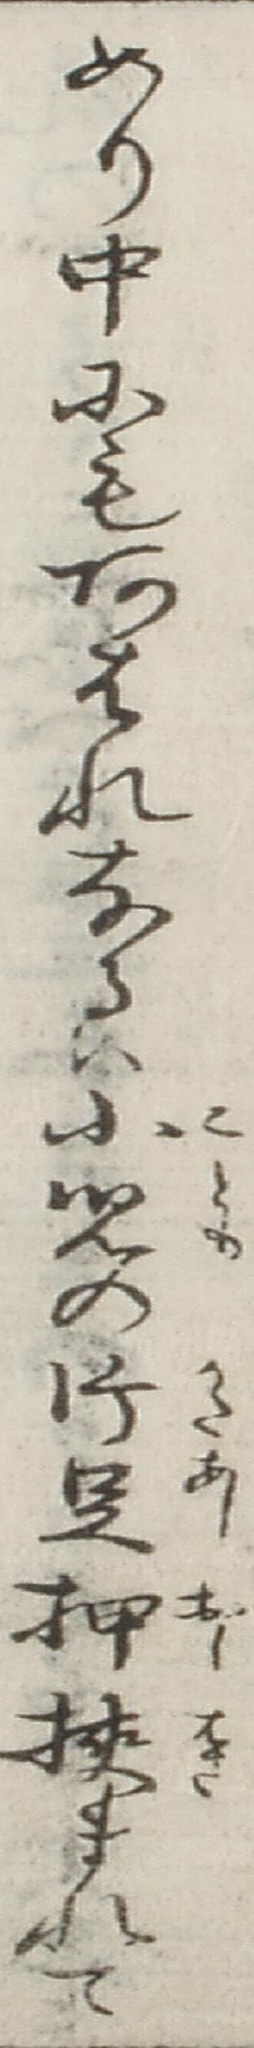めり中にもあはれなるは小児の片足押挟まれて
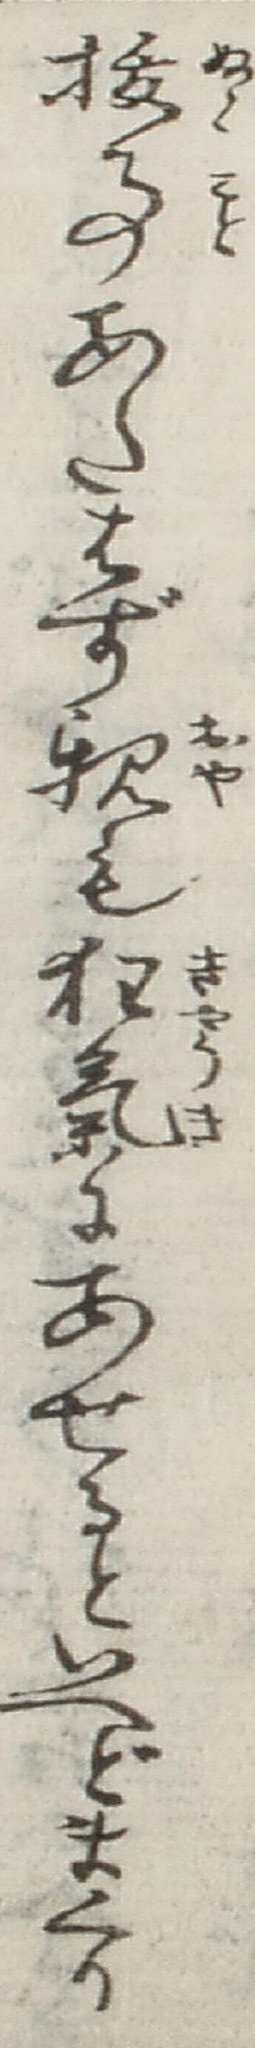抜事あたはず親も狂気にあせるといへどまくり
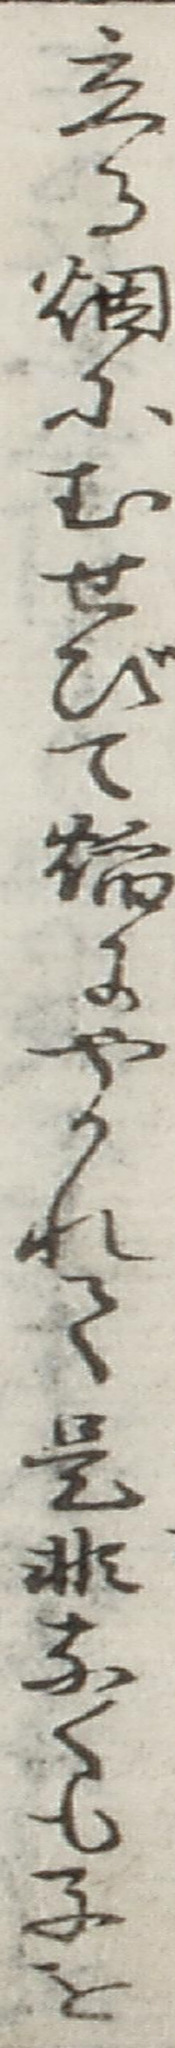立る烟にむせびて焔にやかれて是非なくも子を
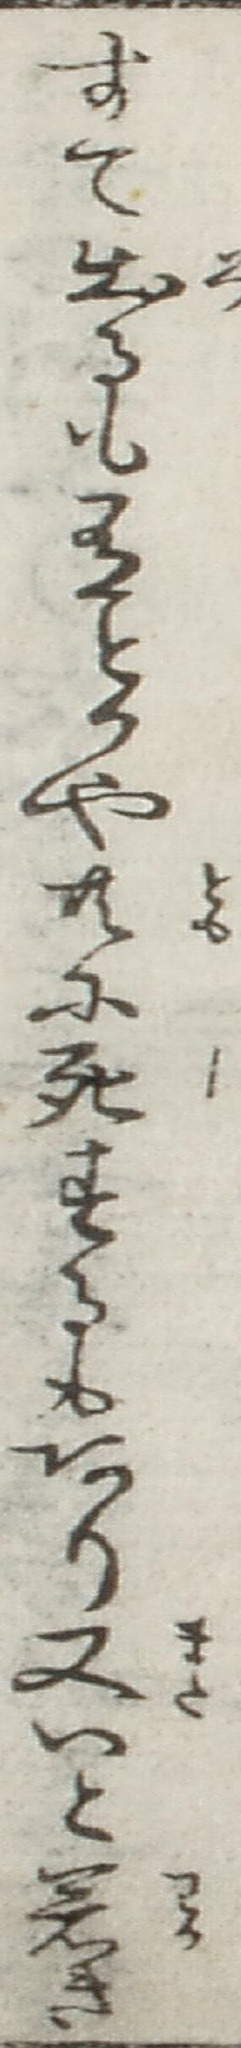すて出るも有とかや共に死するもあり又いと若き
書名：地震世直草紙　全
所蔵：東京大学地震研究所図書室 Earthquake Research Institute Library, The University of Tokyo, JAPAN
